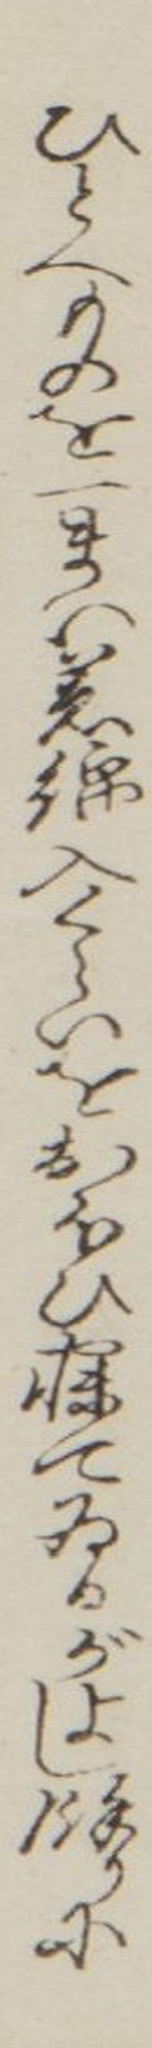ひとへものを一まい着綿入くらいをおほひ寝てゐるがよし餘りに
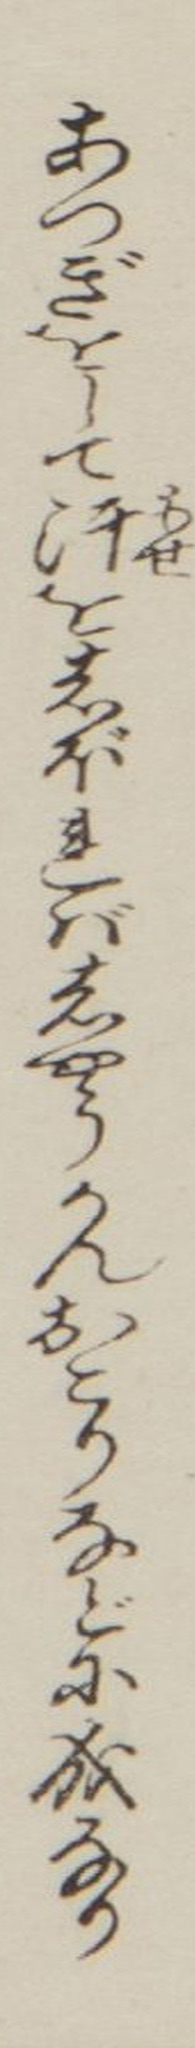あつぎをして汗をしぼればしやうかんおこりなどに成なり
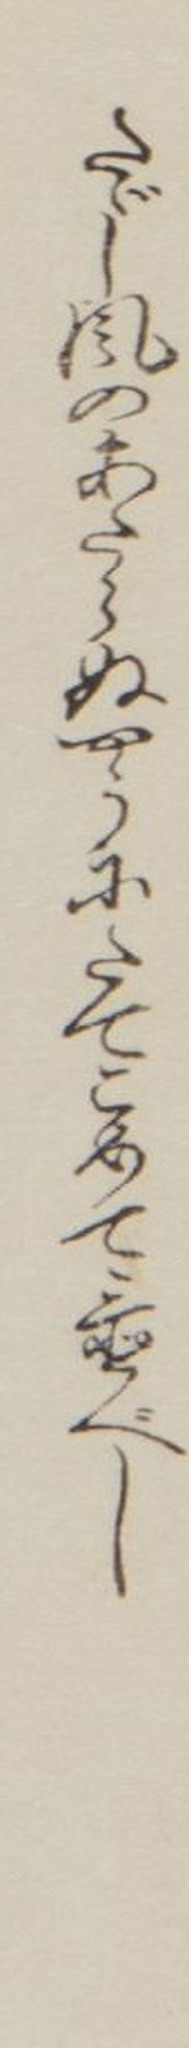ただし風のあたらぬやうにたてこめて置べし
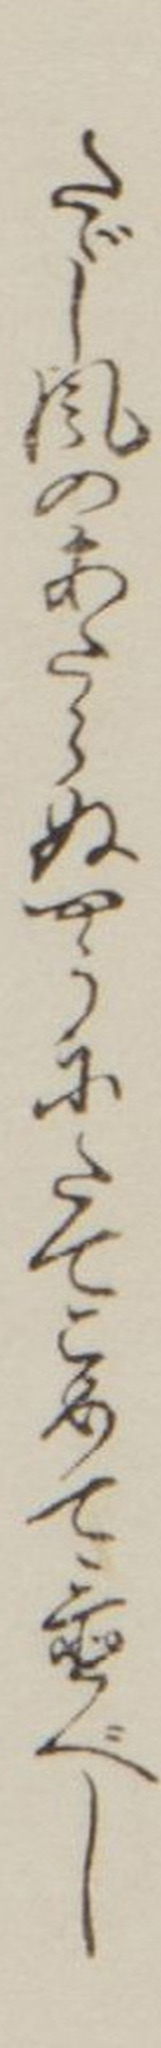ただし風のあたらぬやうにたてこめて置べし
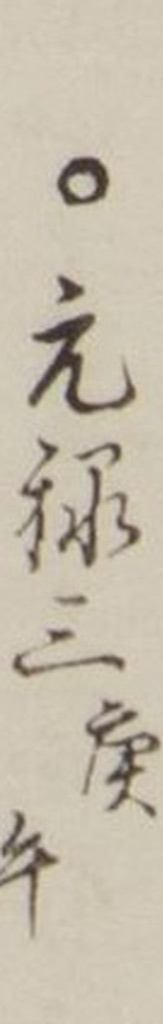○元禄三庚午
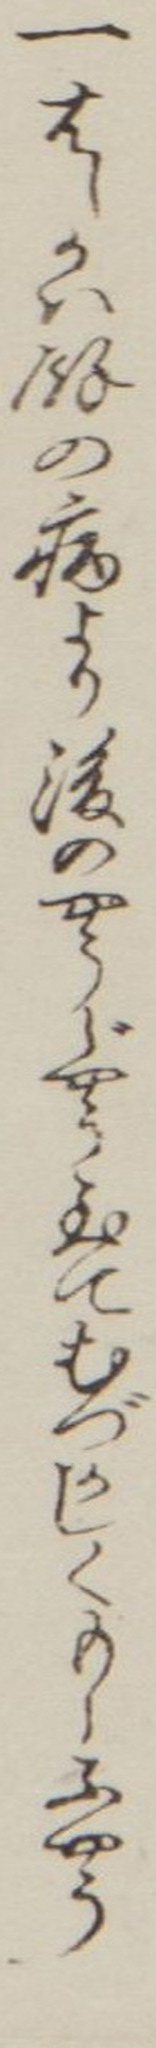一はしかは餘の病より後のやうじやう至てむづかしくもしふやう
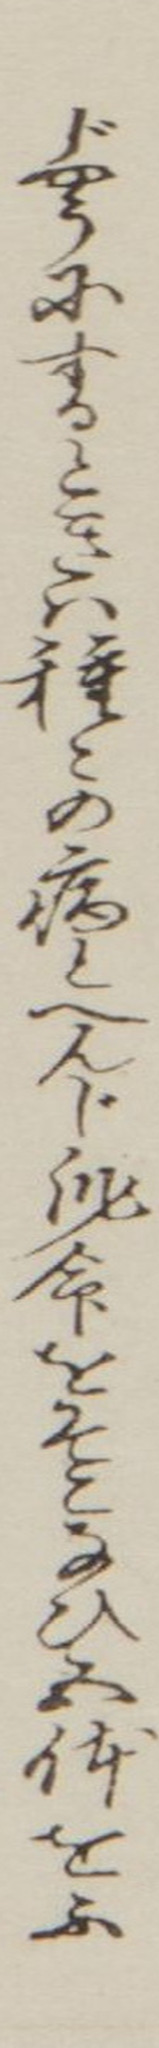じやうにするときは種々の病とへんじ身命をそこなひ五体をふ
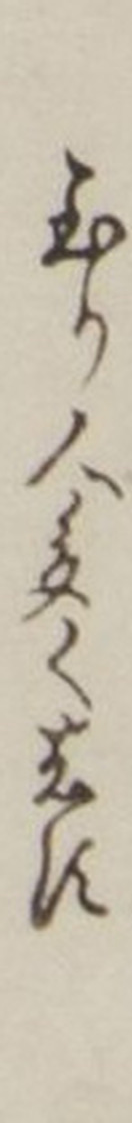至り人多くしす
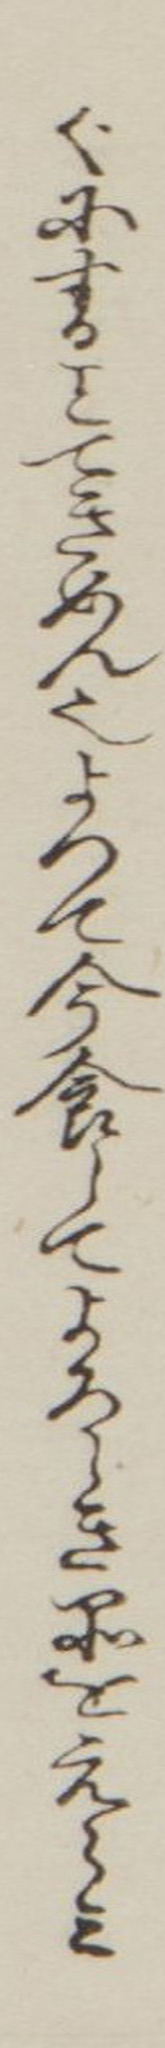ぐにするをてきめん也よつて今食してよろしき品をえらみ

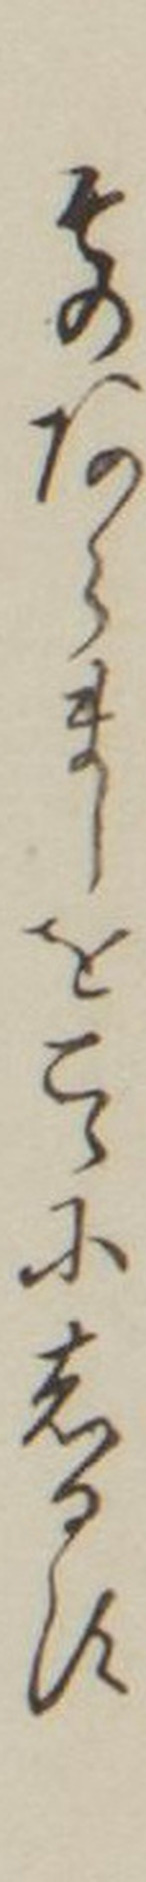そのあらましをこゝにしるす
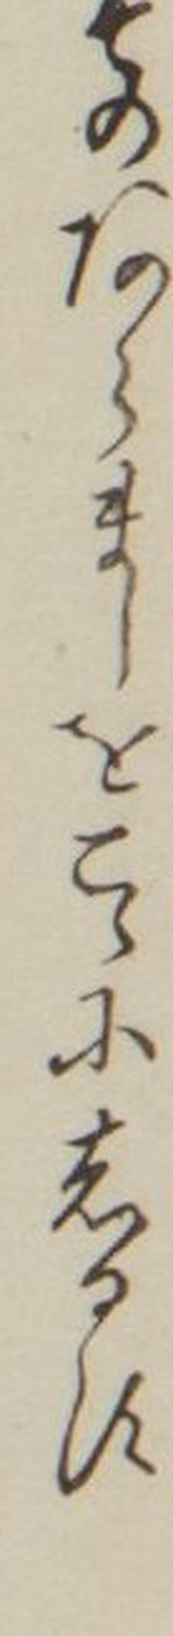そのあらましをこゝにしるす
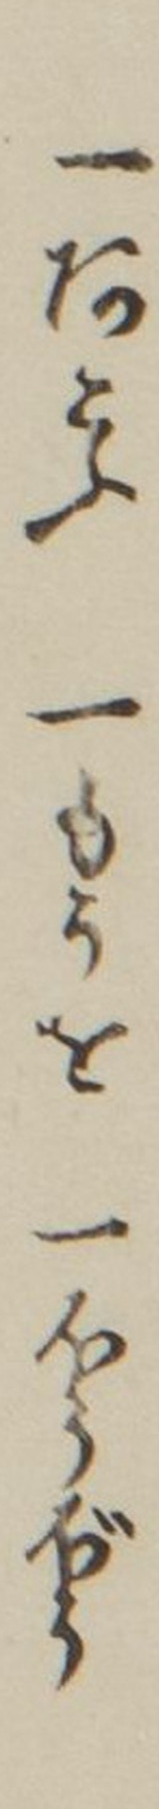一あこふ一もうを一ほうぼう
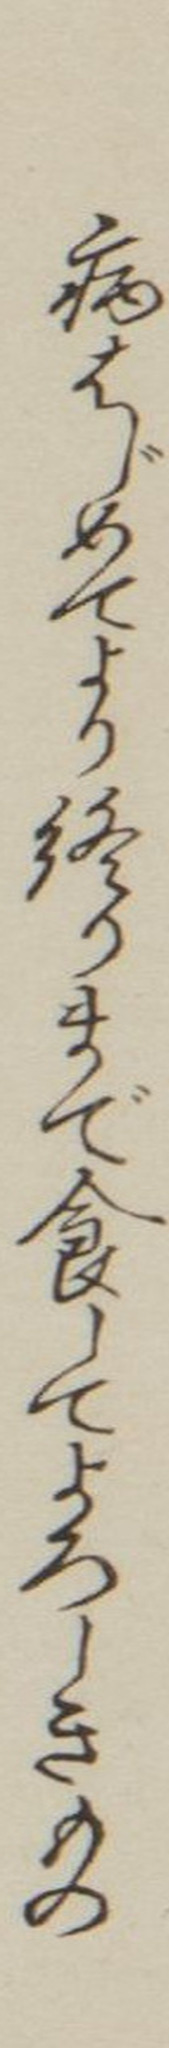病はじめてよりおわりまで食してよろしきもの
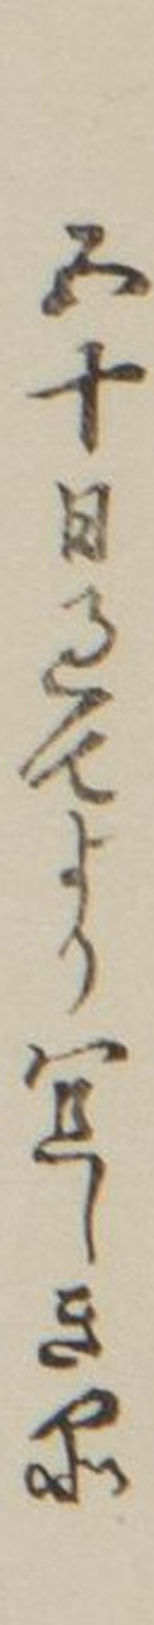五十日過てより宜しき品
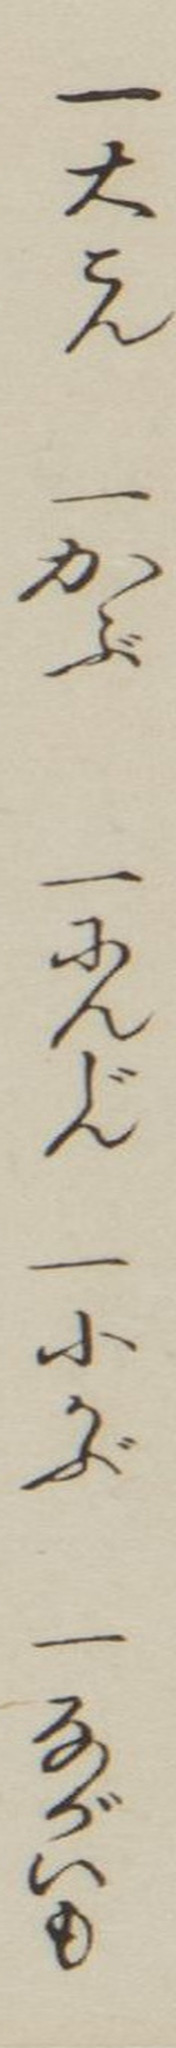一大こん一かぶ一にんじん一小かぶ一ながいも
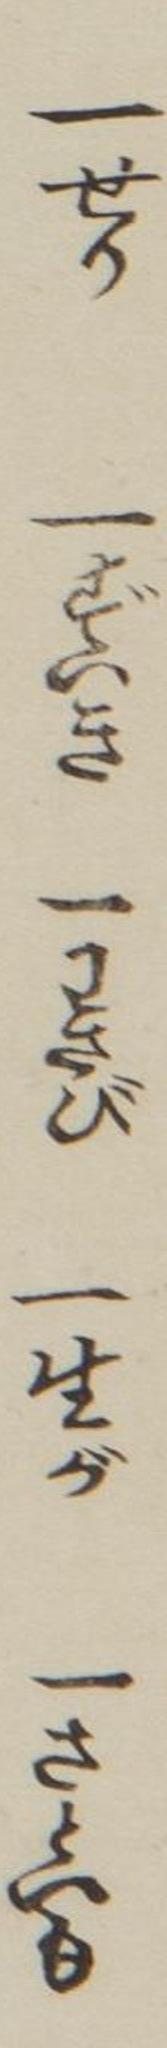一せり一ずいき一わさび一生が一さといも
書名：はしか毒いみ心得艸
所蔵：あいおいニッセイ同和損保株式会社
